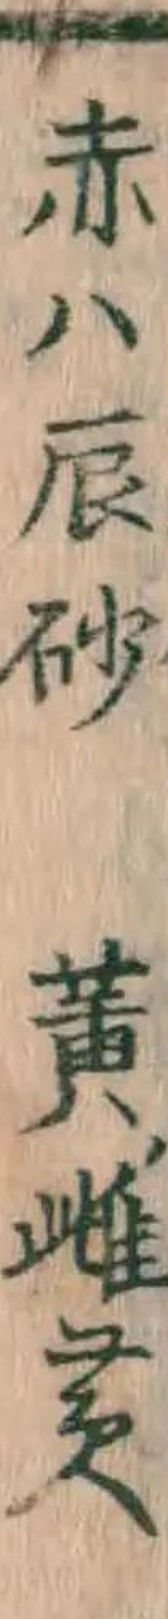赤は辰砂黄は雌黄
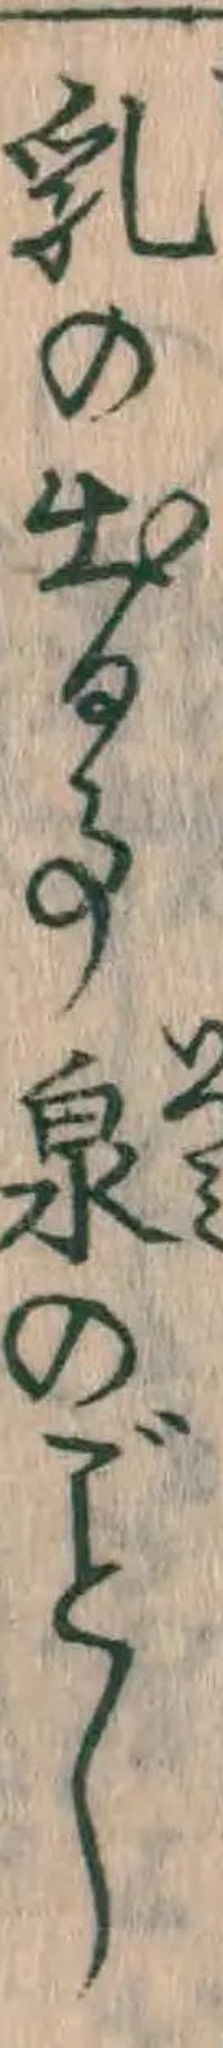乳の出る事泉のごとし
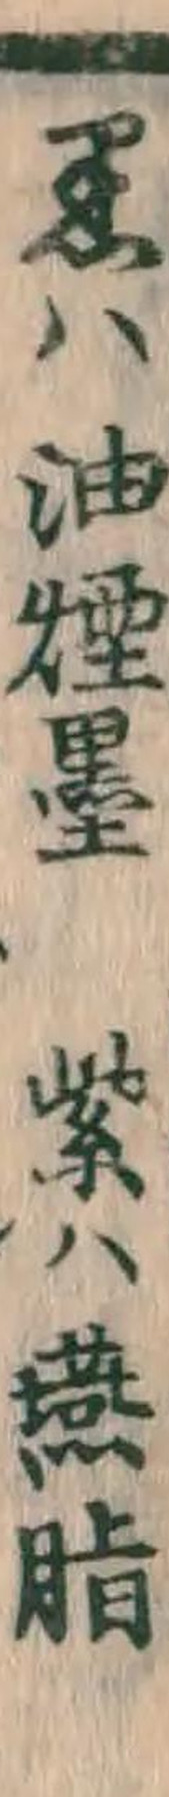黒は油煙墨紫は臙脂
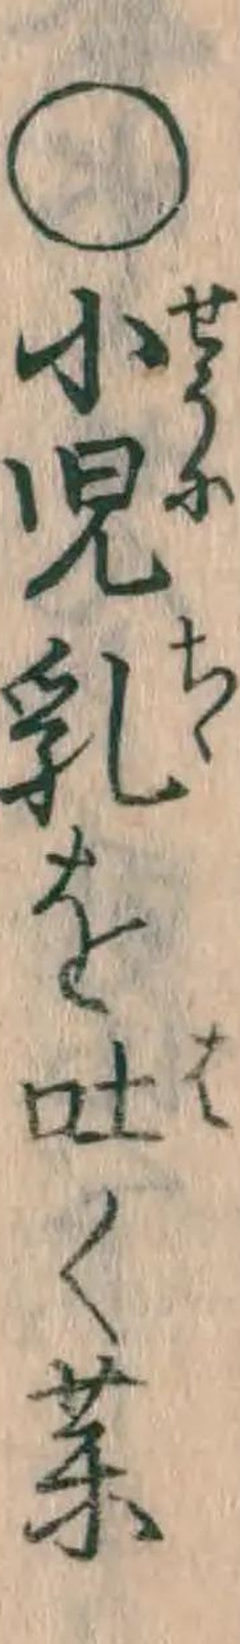○小児乳を吐く薬
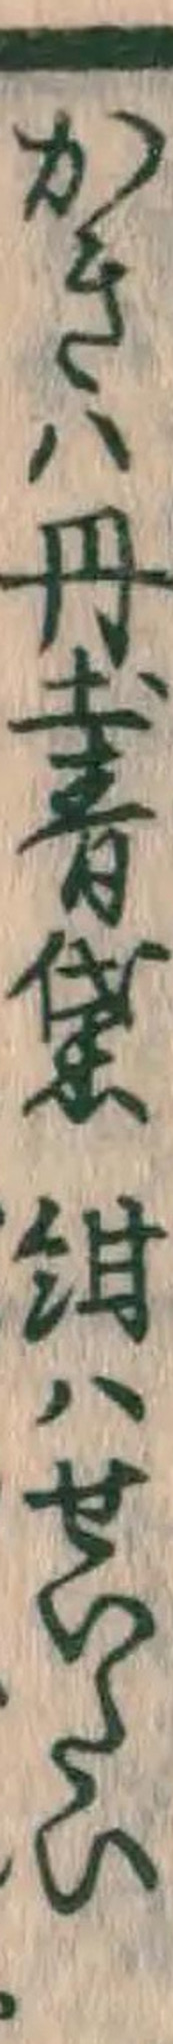かきは丹土青黛紺はせいたい
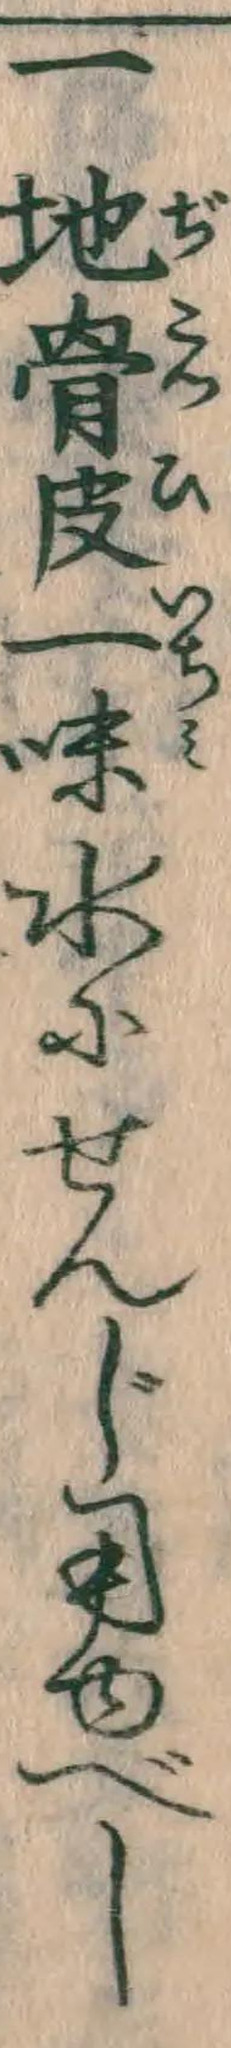一地骨皮一味水にせんじ用ゆべし
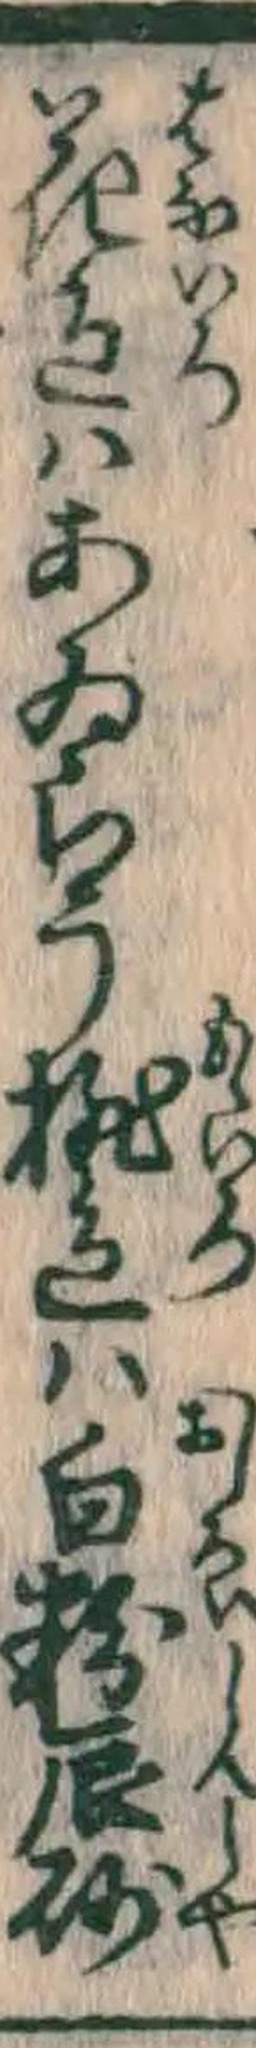花色はあゐらう桃色は白粉辰砂
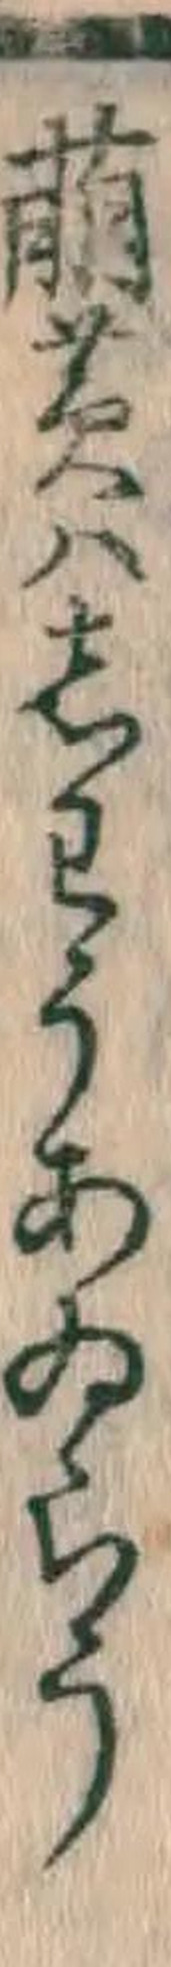萌黄はしわうあゐらう
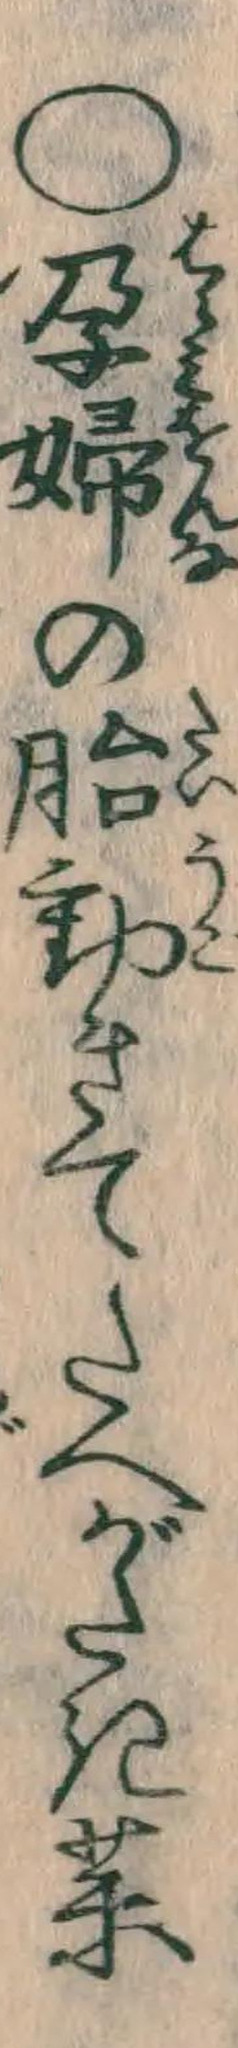○孕婦の胎動きてたへがたき薬
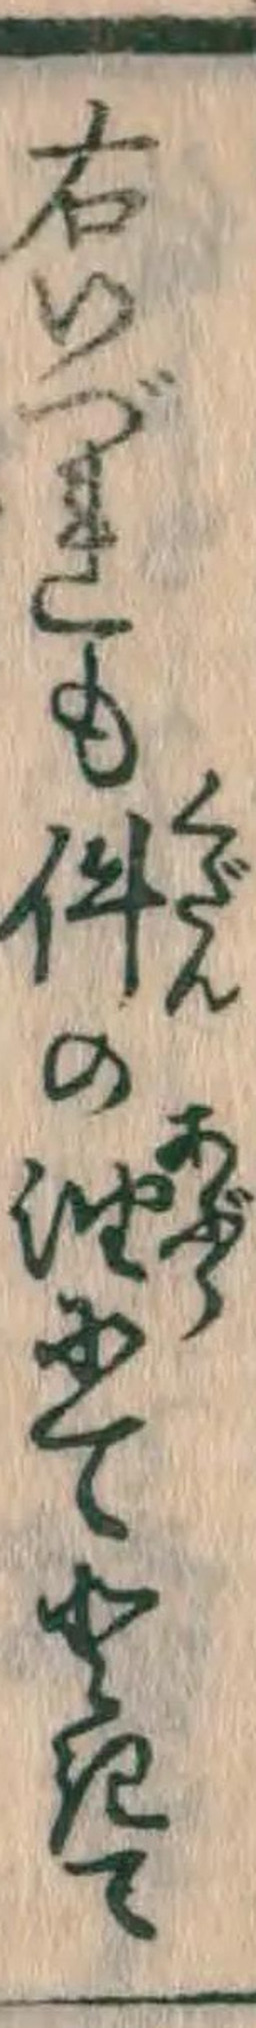右いづれも件の油にてときて
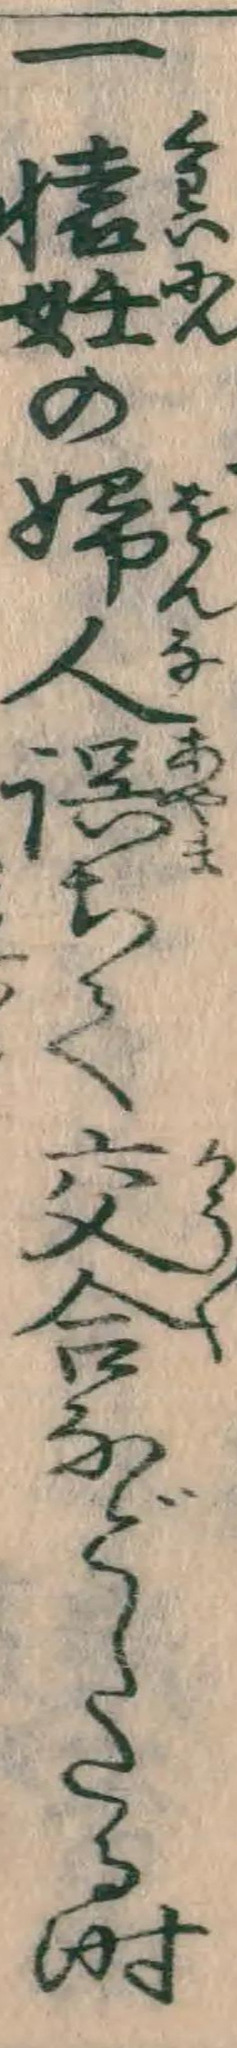一懐妊の婦人誤ちて交合などしたる時
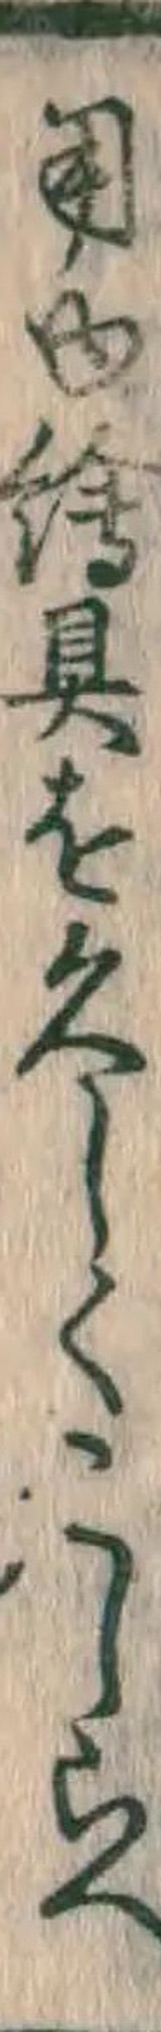用ゆ絵具を久しくこしらへ
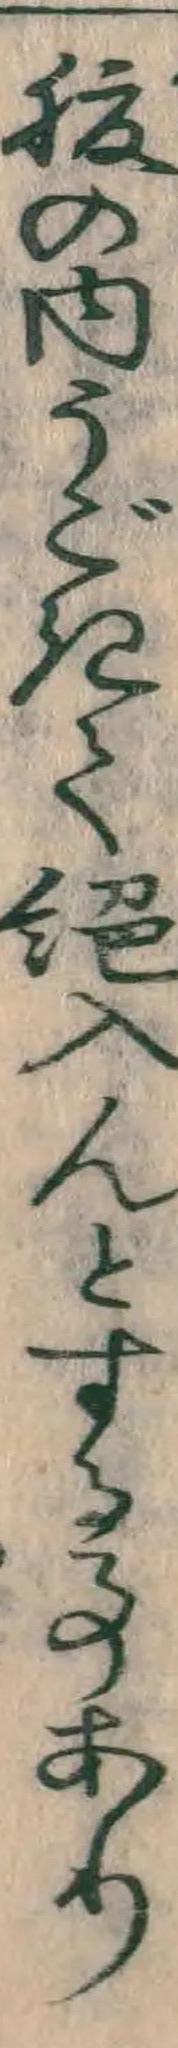腹の内うごきて絶入んとする事あり
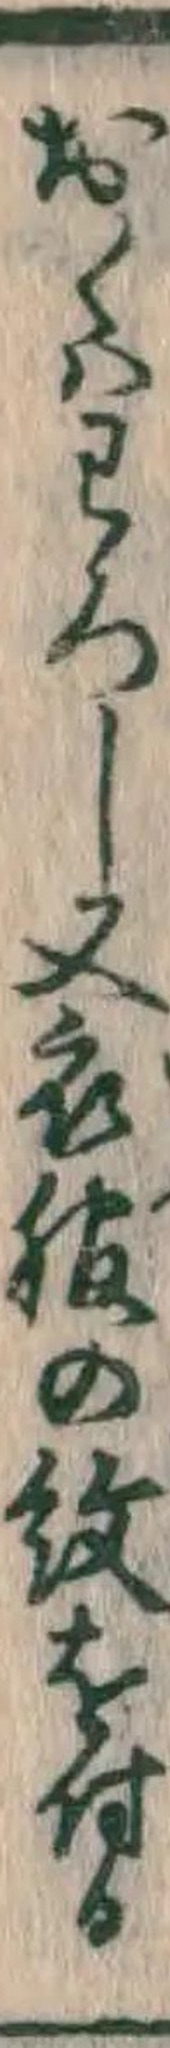おくはわろし又衣服の紋を付る
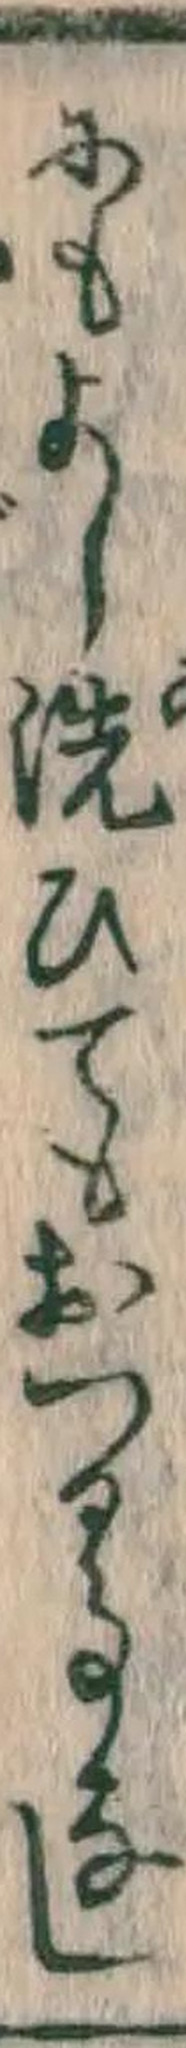にもよし洗ひてもおつる事なし
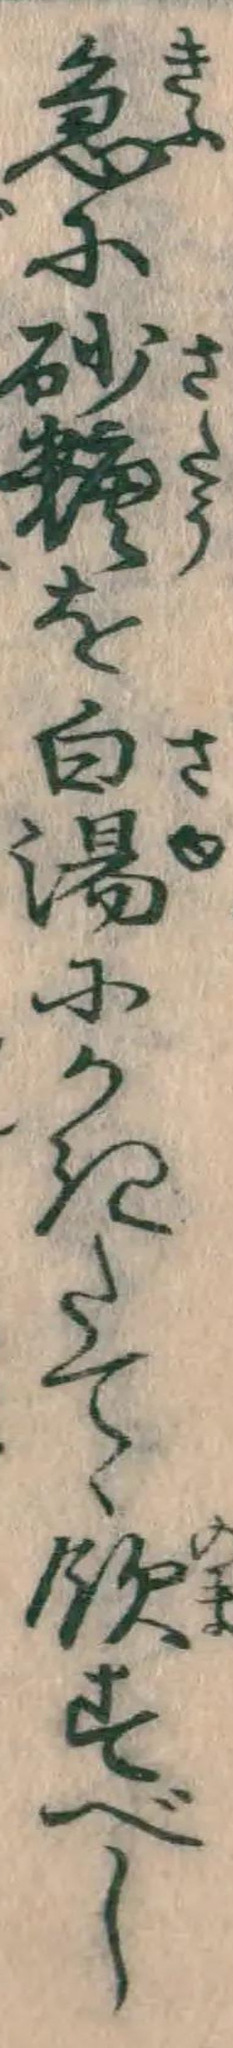急に砂糖を白湯にかきたてゝ飲すべし
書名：広益秘事大全 3巻. [3]
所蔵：国立国会図書館 National Diet Library, JAPAN
